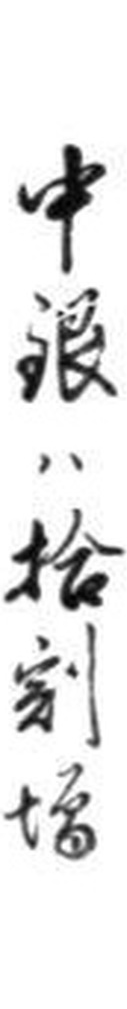中銀ハ拾割増
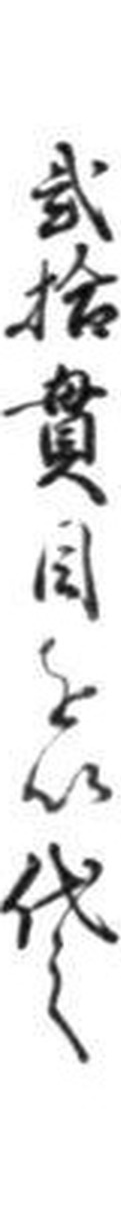弐拾貫目を以代之
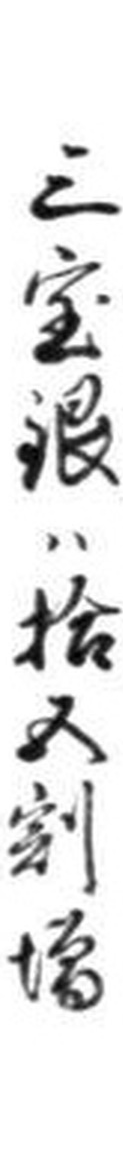三宝銀ハ拾五割増
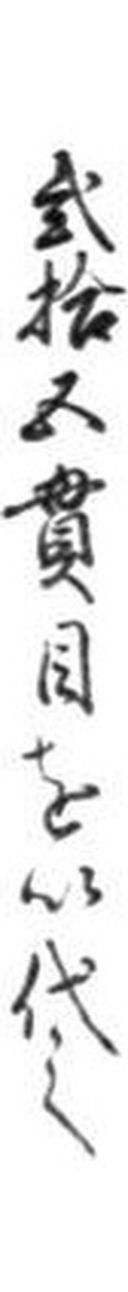弐拾五貫目を以代之
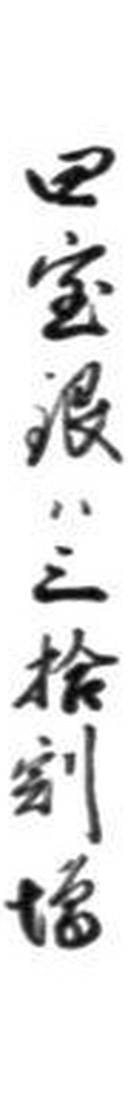四宝銀ハ三拾割増
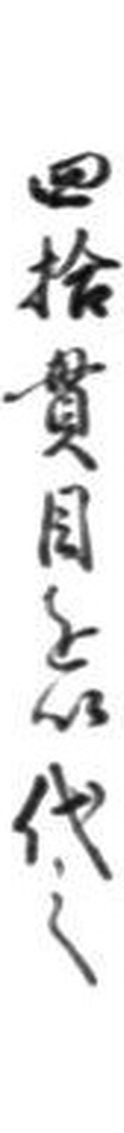四拾貫目を以代之
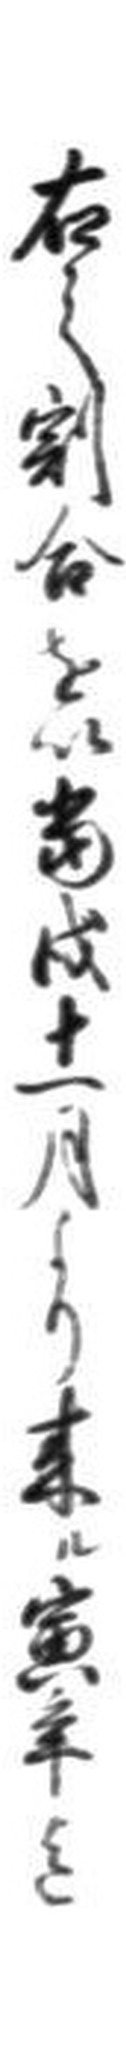右之割合を以当戌十一月より来ル寅年迄
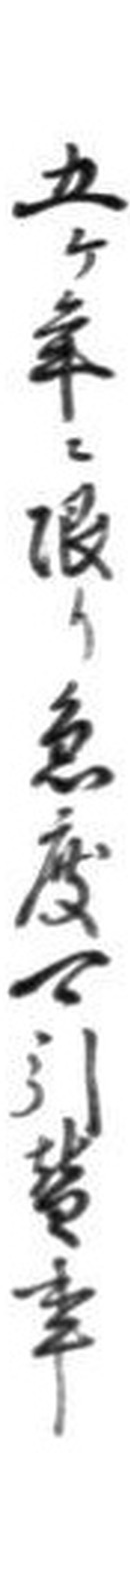五ケ年ニ限り急度可引替事
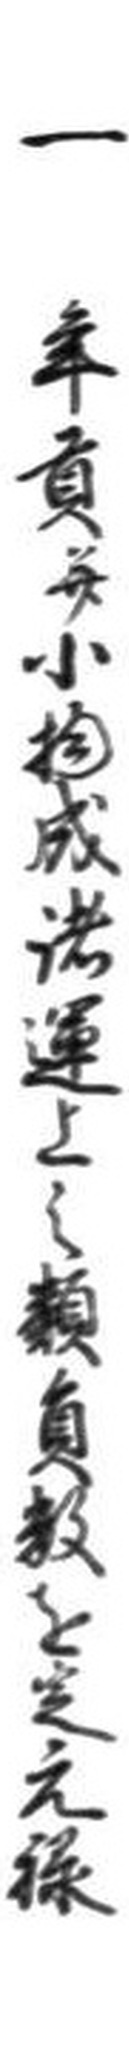一年貢并小物成諸運上之類員数を定元禄
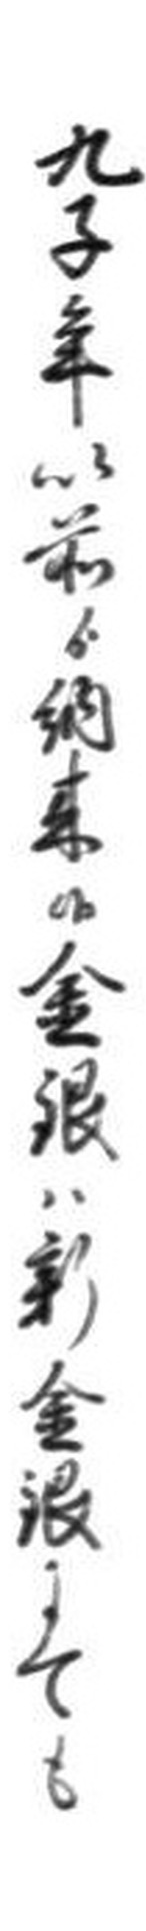九子年以前ゟ納来候金銀ハ新金銀にても
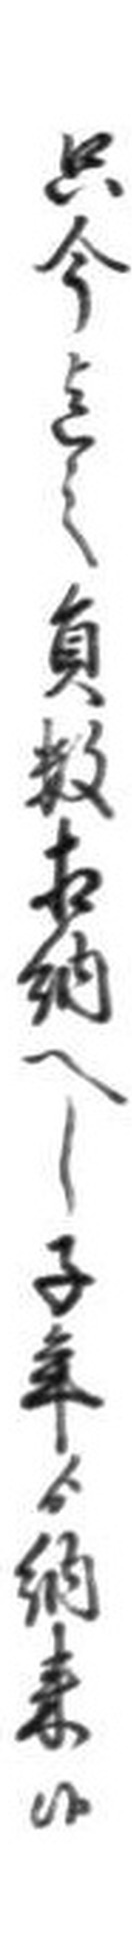只今迄之員数相納へし子年ゟ納来候
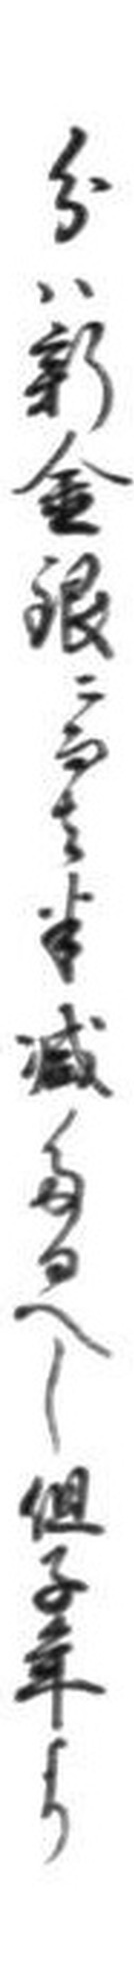分ハ新金銀ニ而者半減たるへし但子年より
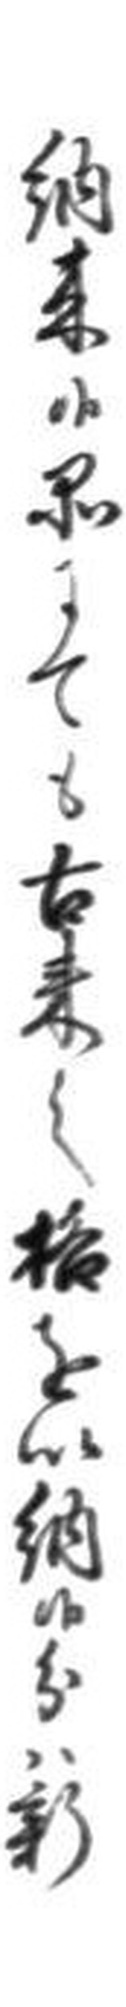納来候品にても古来之格を以納候分ハ新

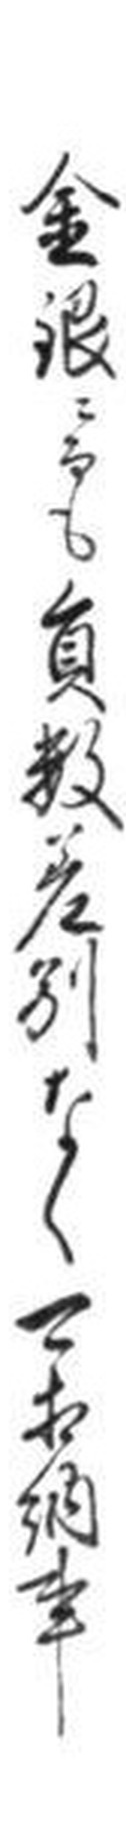金銀ニ而も員数差別なく可相納事
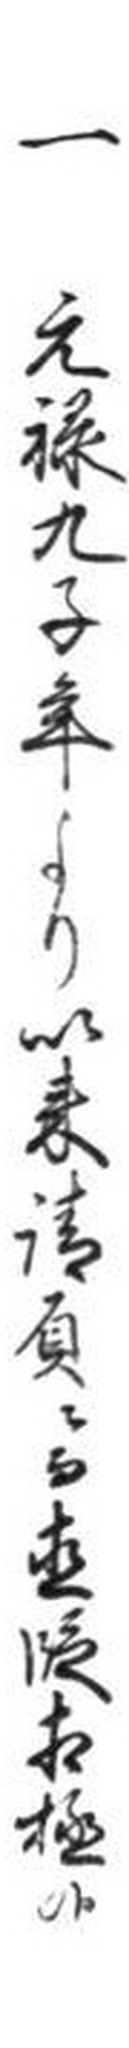一元禄九子年より以来請負ニ而直段相極候
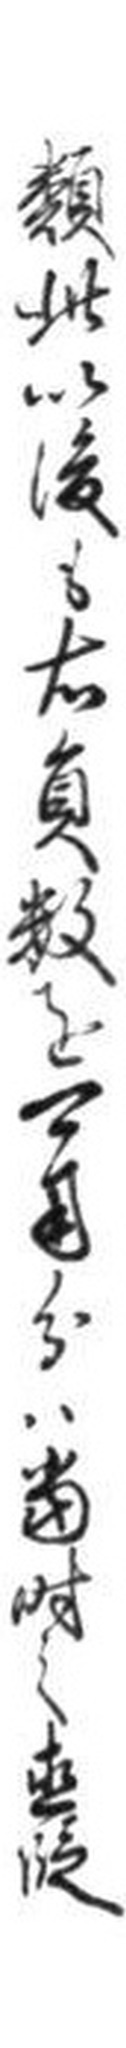類此以後も右員数を可用分ハ当時之直段
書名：家譜 三十二 吉邦公 従享保二年到享保三年
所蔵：福井県文書館 Fukui Prefectural Archives
